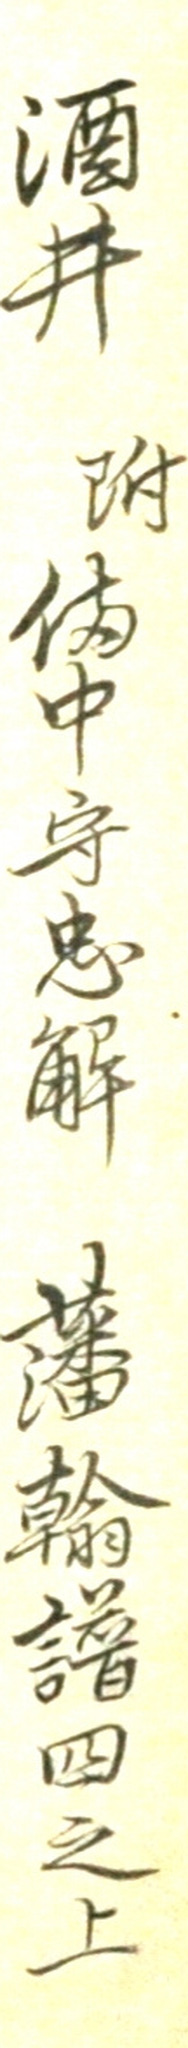酒井付備中守忠解藩翰譜四之上

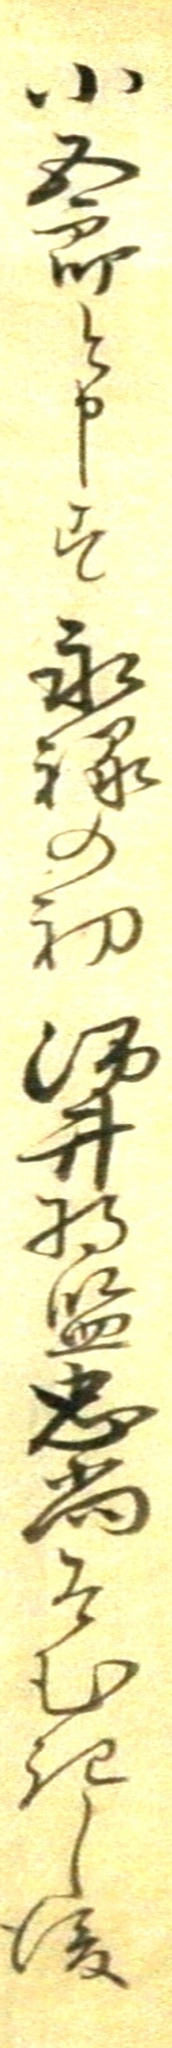小五郎と申す永禄の初酒井将監忠尚そむきし後
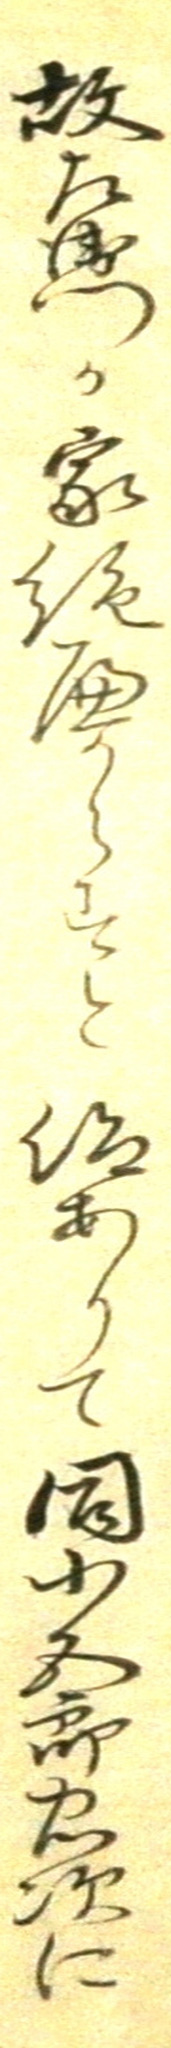故左衛門か家絶へからすと仰ありて同小五郎忠次に

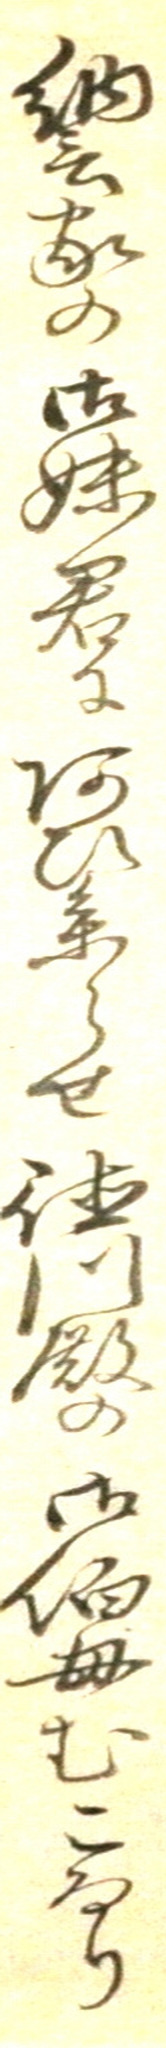納言家の御妹君にあひ参らせ徳川殿の御伯母むこなり
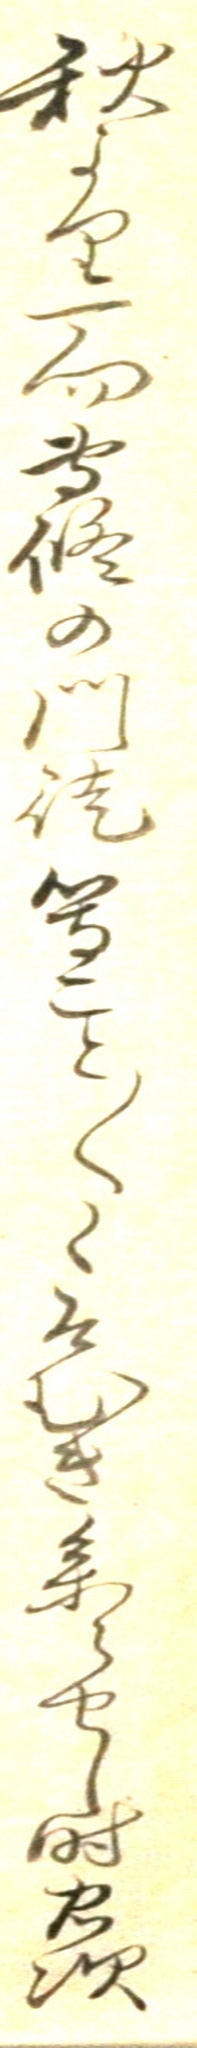秋より一向専修の門徒等こと〳〵くそむき参らせし時忠次
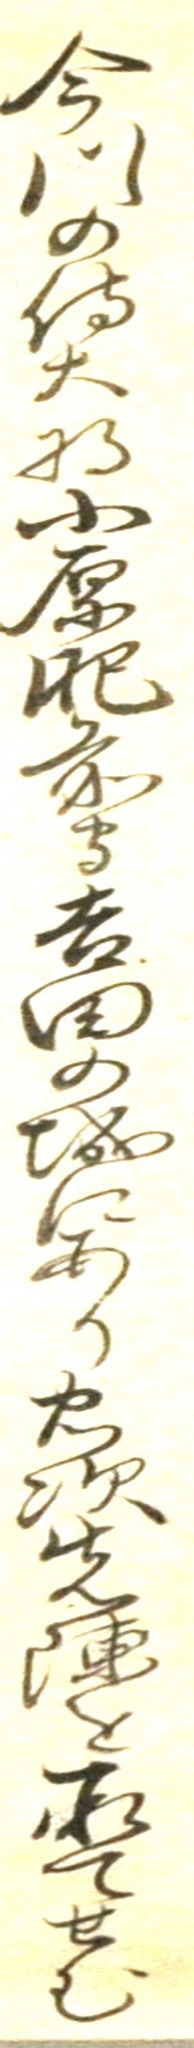今川の侍大将小原肥前守吉田の城にあり忠次先陣を承てせむ
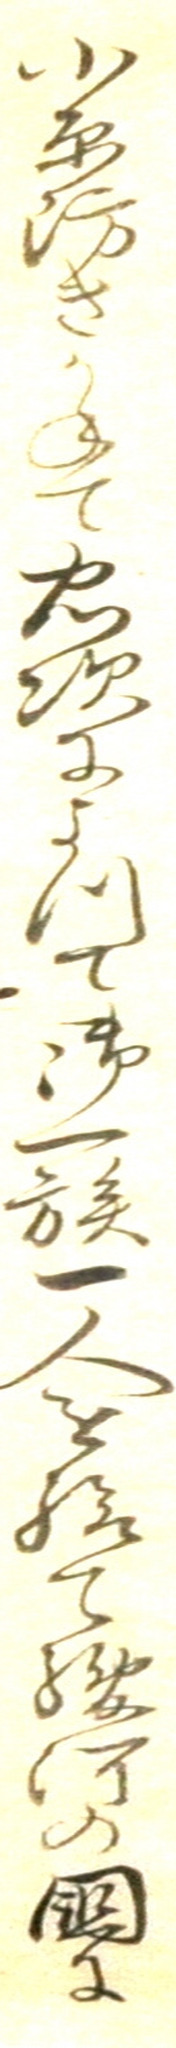小原防きかねて忠次によつて御一族一人を給て駿河の国に
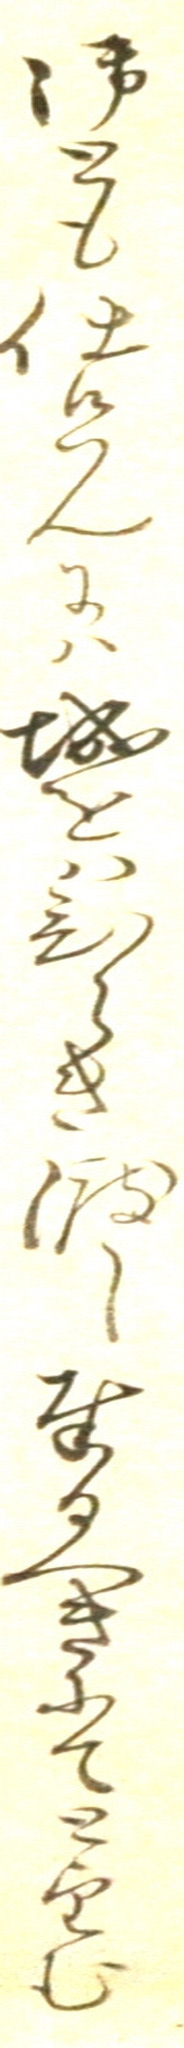御とも仕候はんには城をはひらき渡し奉るへきにてと望む
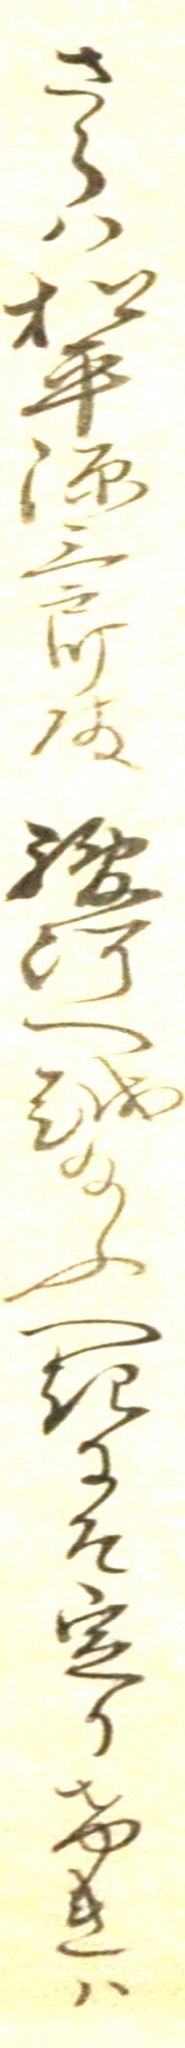さらは松平源三郎殿駿河へ越給ふへきにそ定りけれは
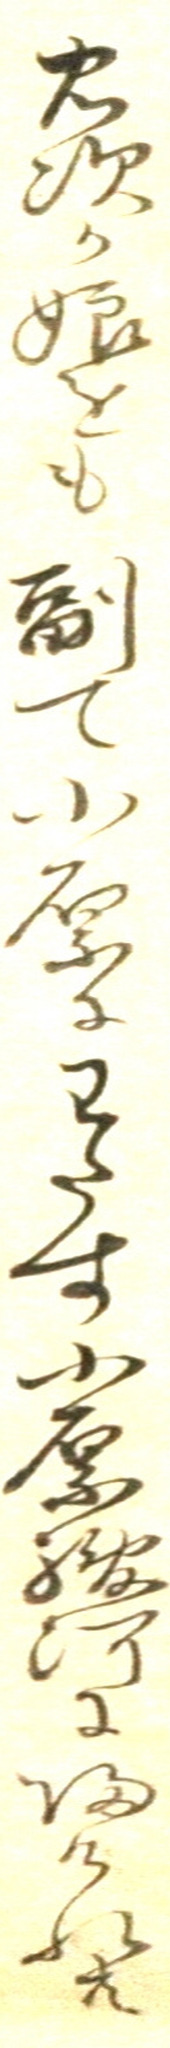忠次か娘をも副て小原にわたす小原駿河に帰けれ共
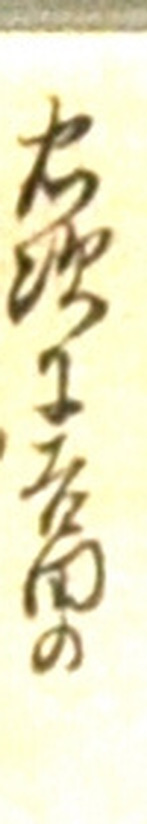忠次に吉田の
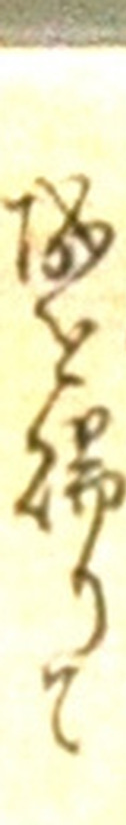城を賜りて
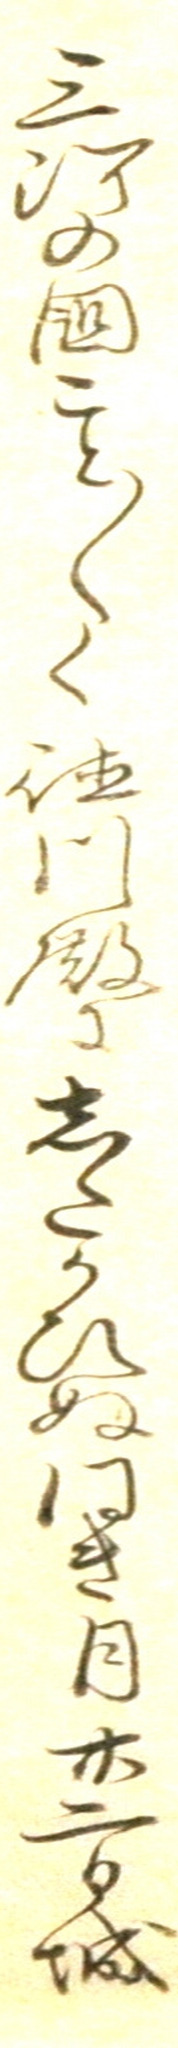三河の国こと〳〵く徳川殿にしたかひぬ同き月廿二日城
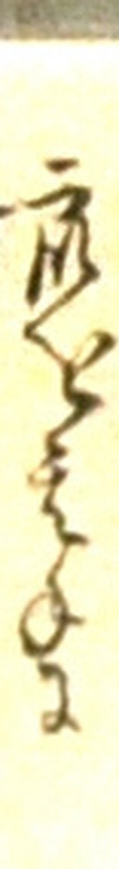衆を其手に
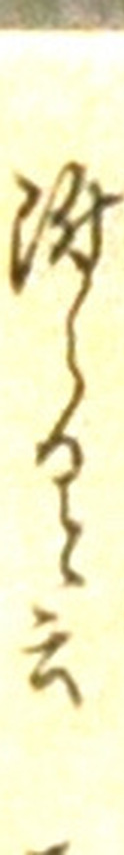付らると云

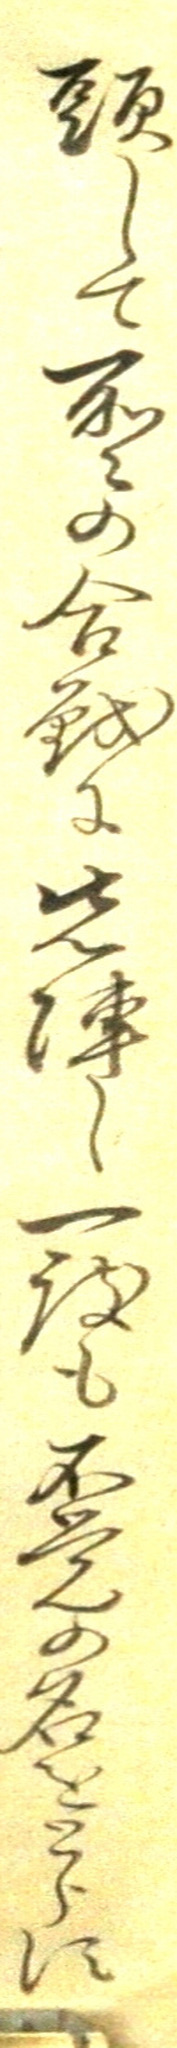頭して所々の合戦に先陣し一度も不覚の名をとらす
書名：藩翰譜（四・上）
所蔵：伊那市立高遠町図書館・合同会社AMANE
